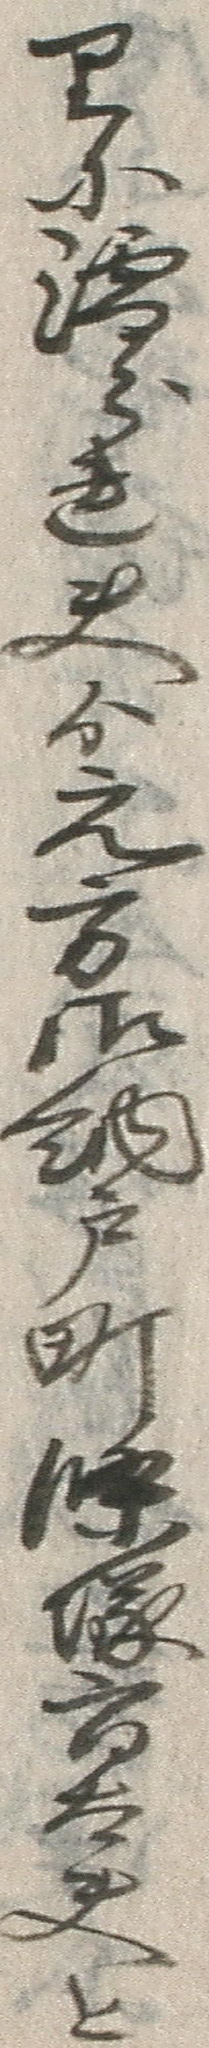里に濡られ夫ゟ元方御納戸町條塚市太夫と
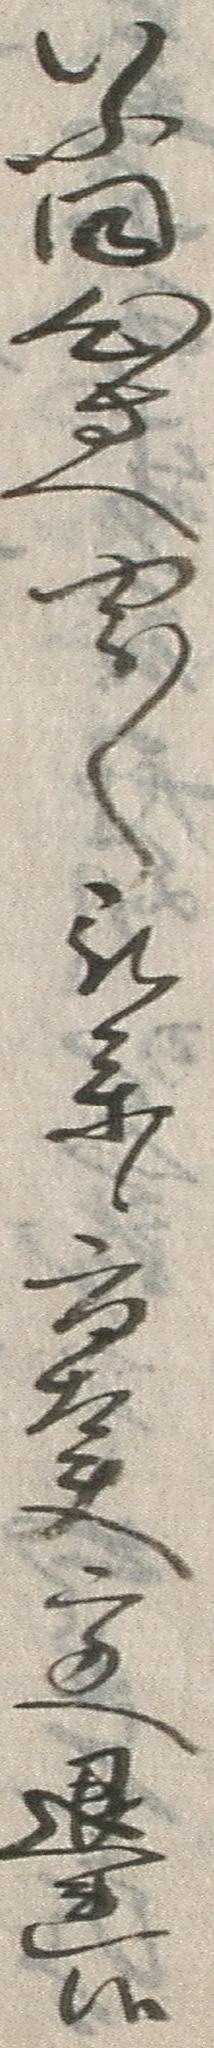いふ同心方へゆる〳〵被参候市太夫方へ退れ候
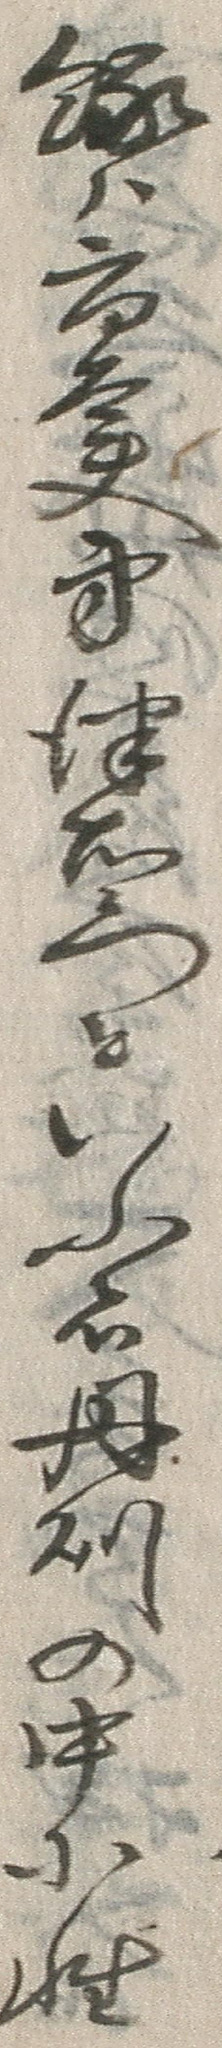縁は市太夫弟津右衛門といふ者丹州の中小性
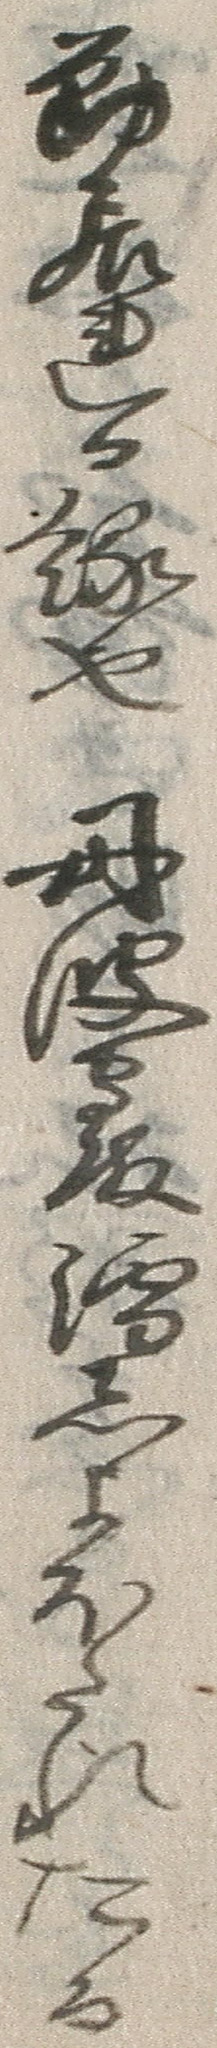勤居れる縁也丹波守殿濡しよほたれたる
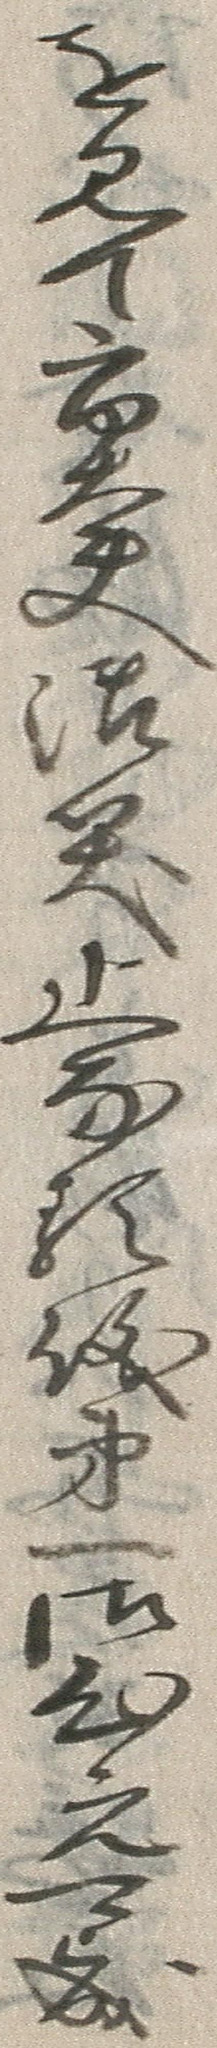を見て市太夫御笑止なる儀第一御心え可被成
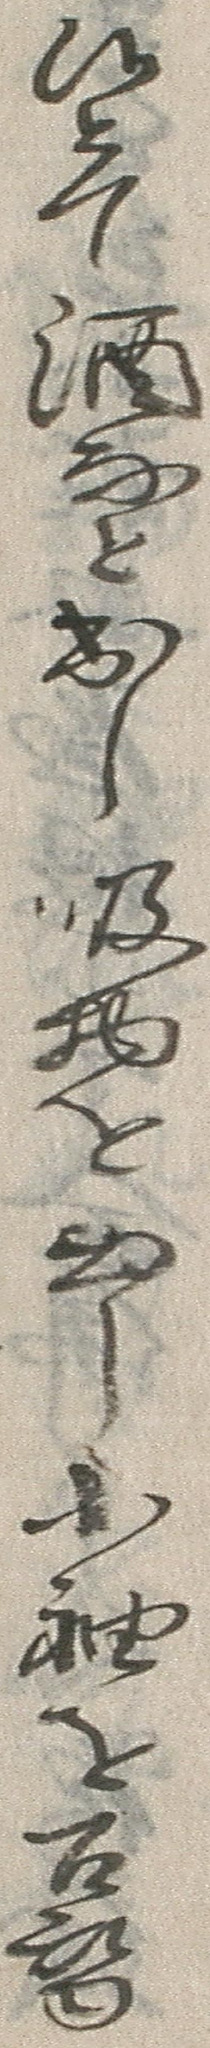候とて酒なと出し吸物を出し小袖を召替
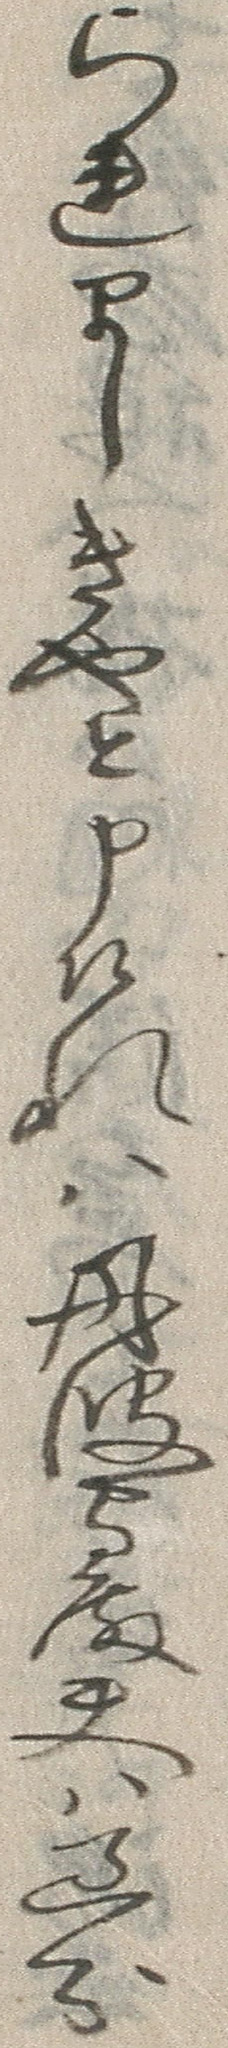られましきやと申けれは丹波守殿夫は過分
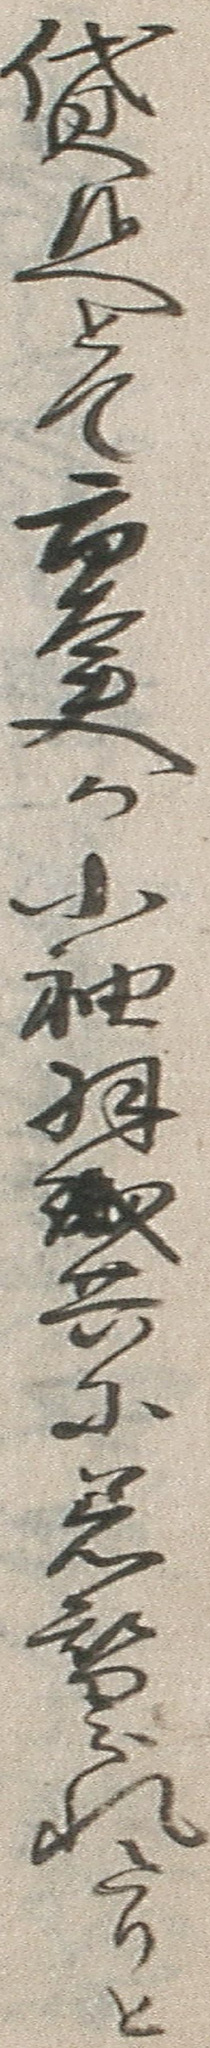貸候へとて市太夫か小袖羽織共に差替られたりと
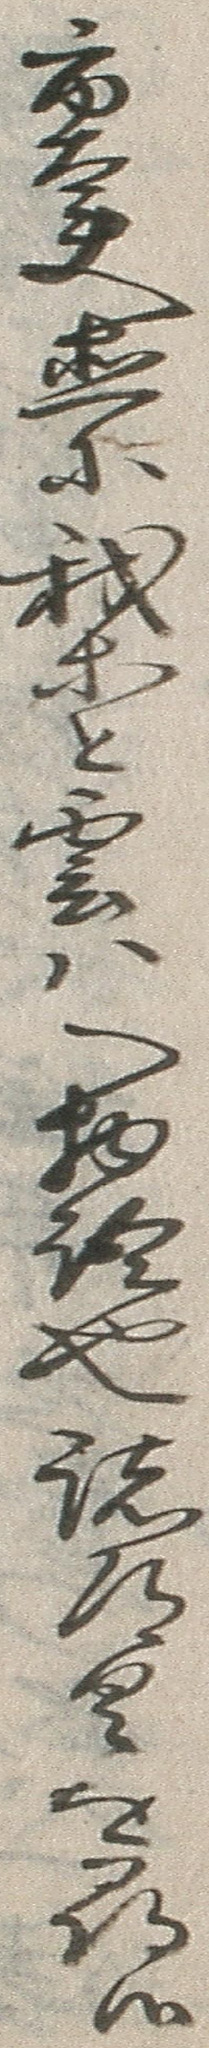市太夫直に我等と雲八へ物語也諸道具を尋候
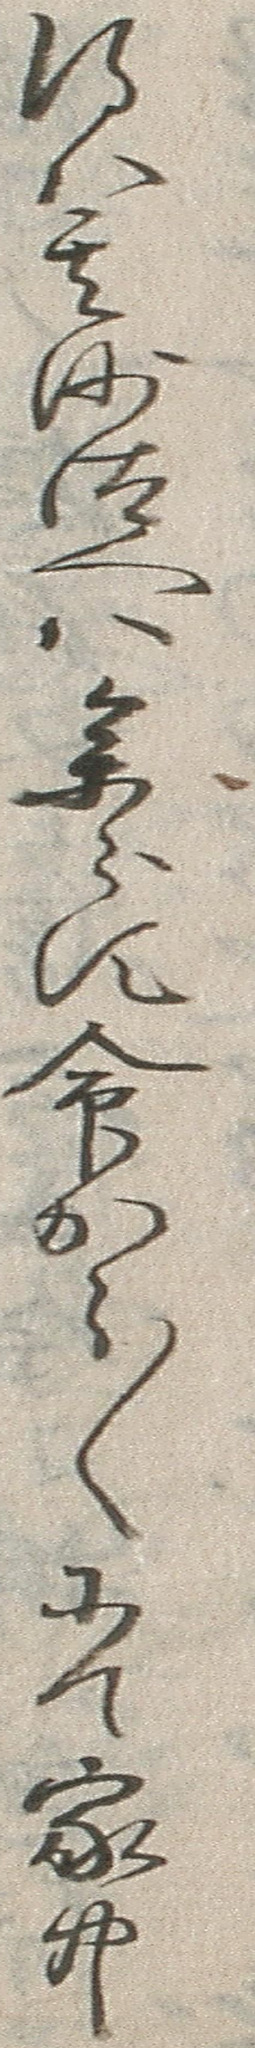得は其沙汰は参らす命から〳〵にて家中
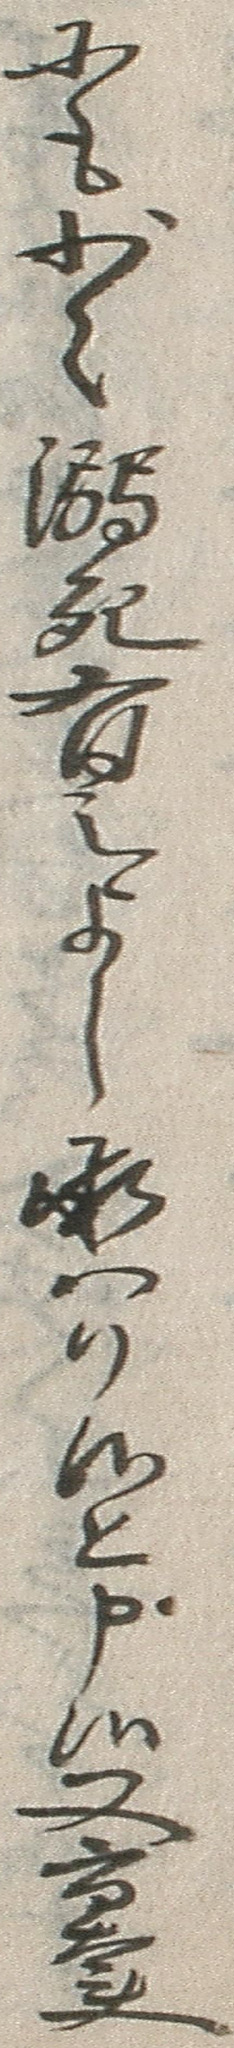にも少し溺死有之よし承はり候と申候又市太夫
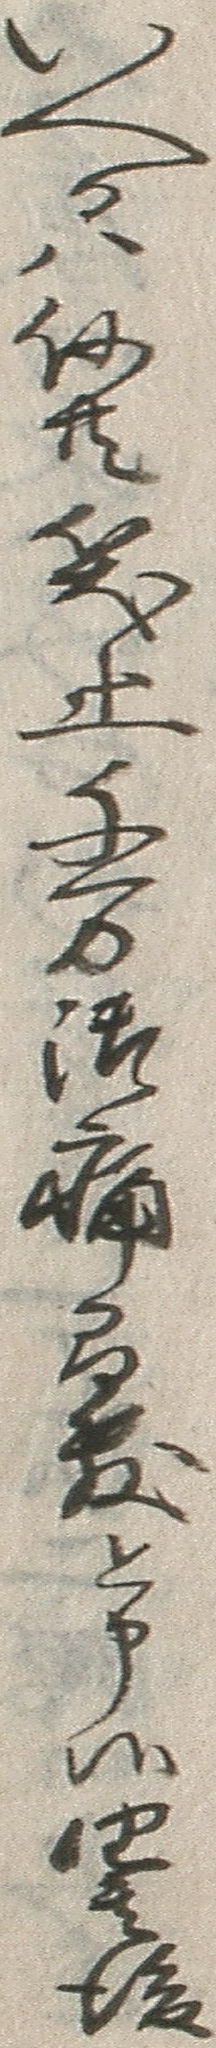いへるは何共笑止千万御痛間敷と申候由其後
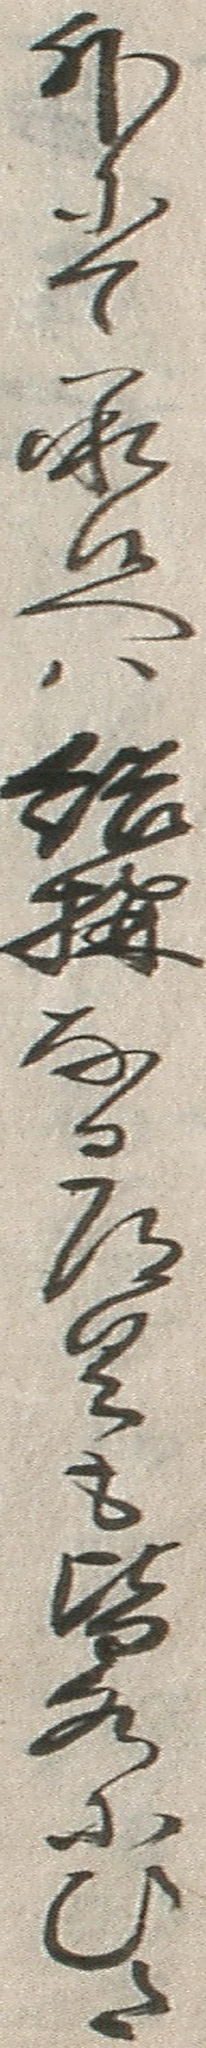外にて承候へは結構なる道具も皆水にひた
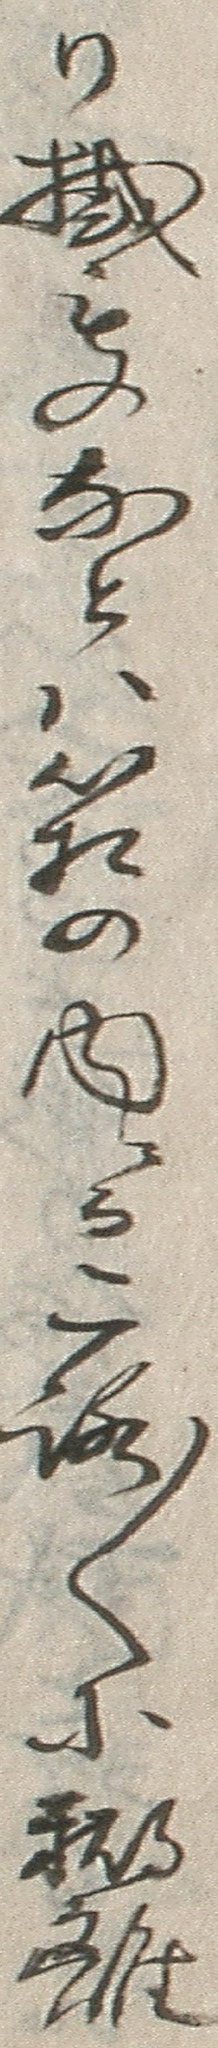り掛ものなとは箱の内にてころ〳〵に糊離
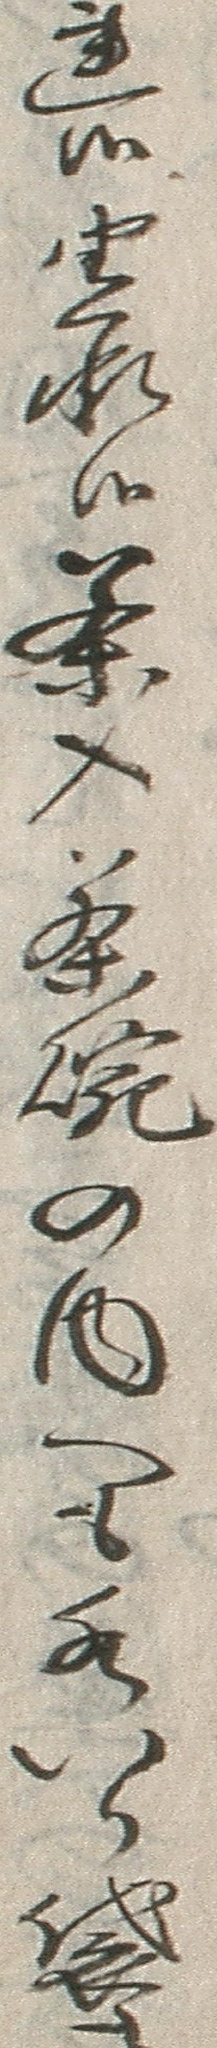れ候由承候茶入茶碗の内へも水いり袋も
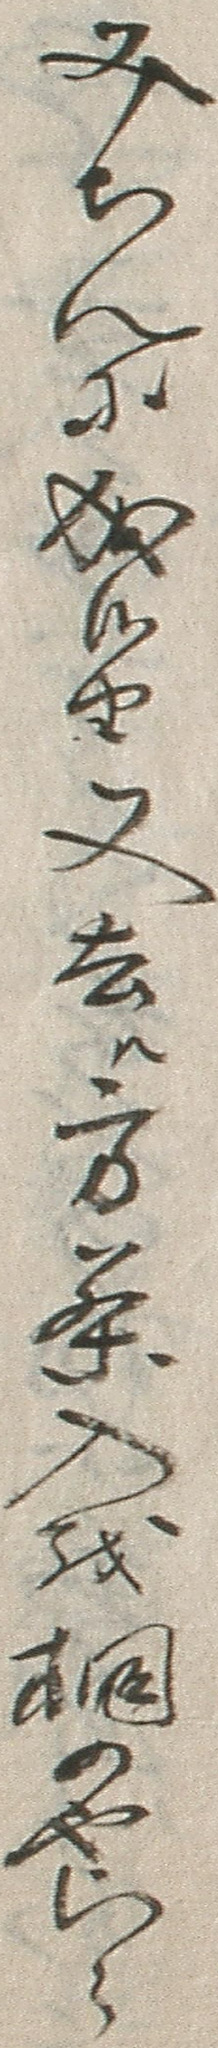みちんに成候由又去ル方茶入を桐のやらう
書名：享保十三年江戸洪水記
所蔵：東京大学地震研究所図書室 Earthquake Research Institute Library, The University of Tokyo, JAPAN
